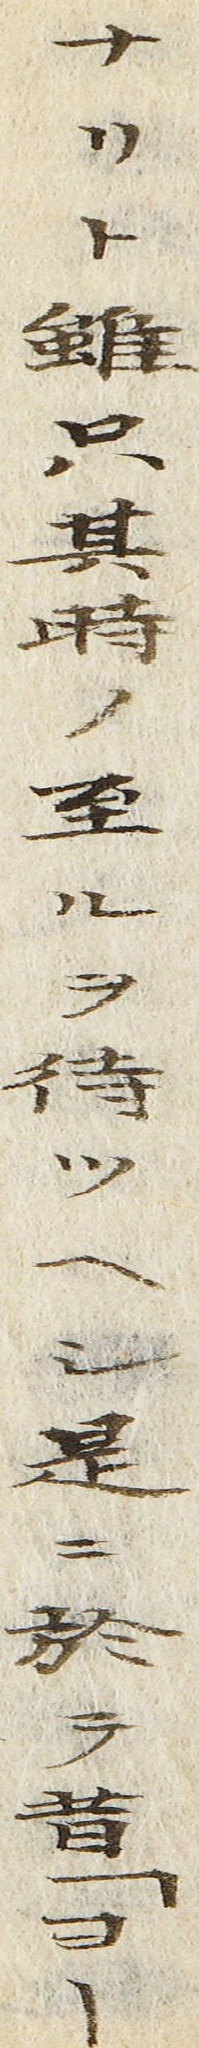ナリト雖只其時ノ至ルヲ待ツヘシ是ニ於テ昔「ヨー
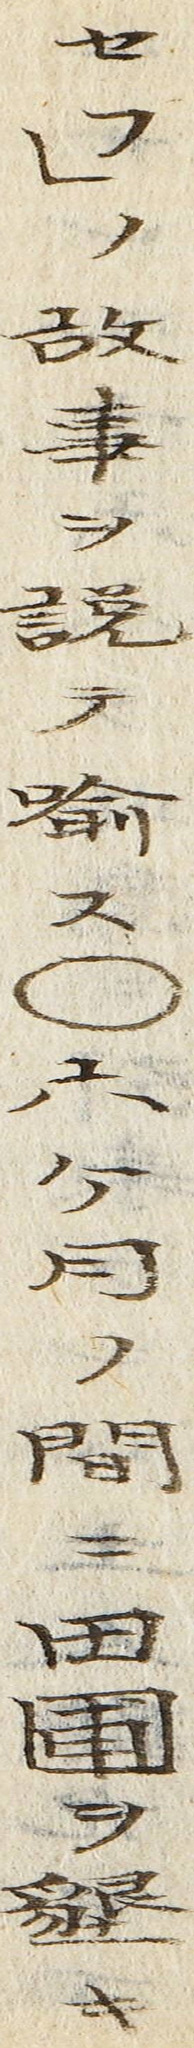セフ」ノ故事ヲ説テ喩ス◯六ケ月ノ間ニ田圃ヲ墾キ
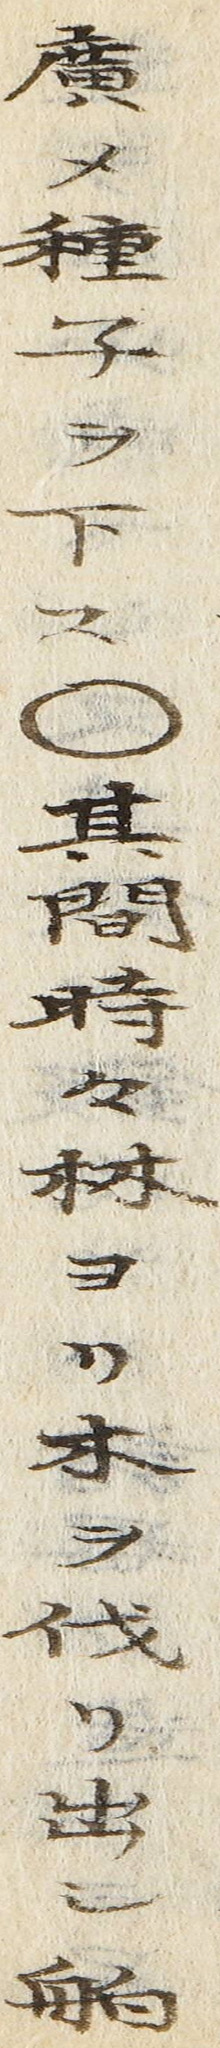広メ種子ヲ下ス◯其間時々林ヨリ木ヲ伐リ出シ舶
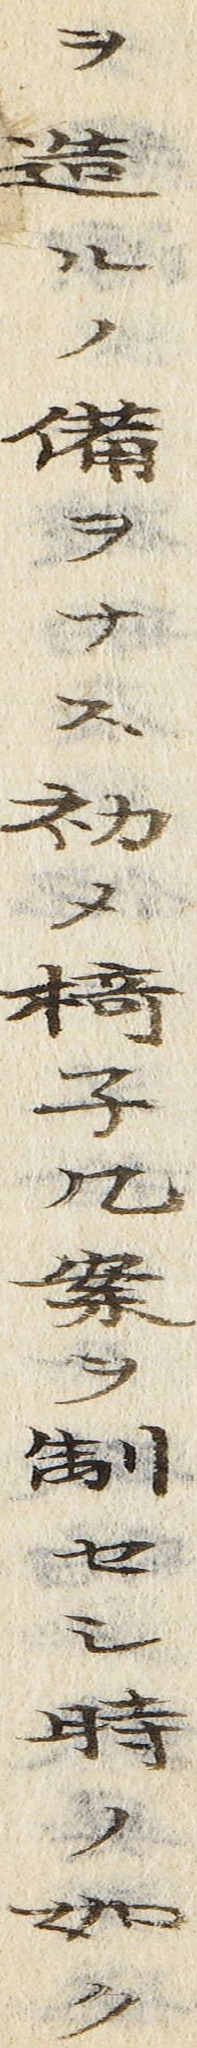ヲ造ルノ備ヲナス初メ椅子几案ヲ制セシ時ノ如ク
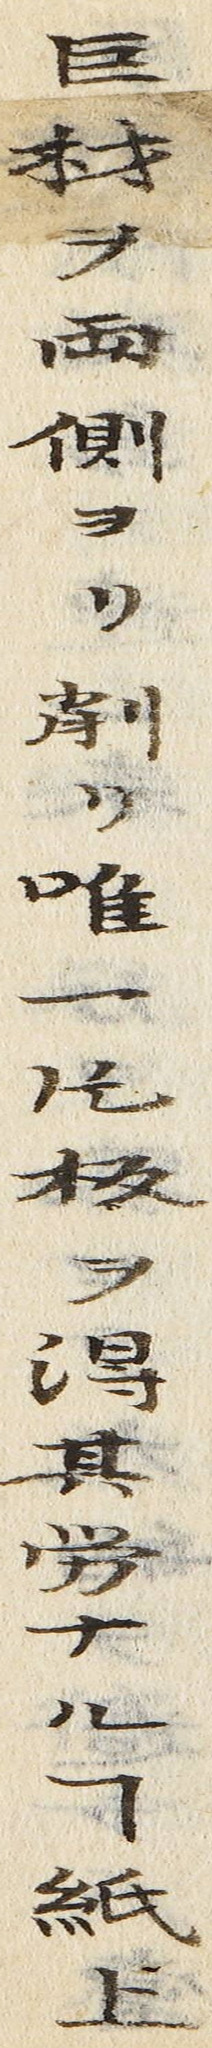巨材ヲ両側ヨリ削リ唯一片板ヲ得其労ナルコト紙上
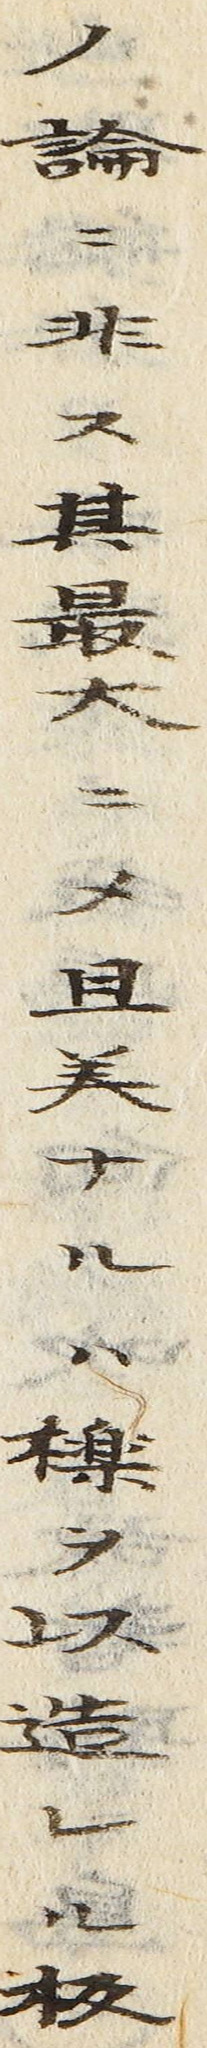ノ論ニ非ス其最大ニシテ且美ナルハ櫟ヲ以造レル板
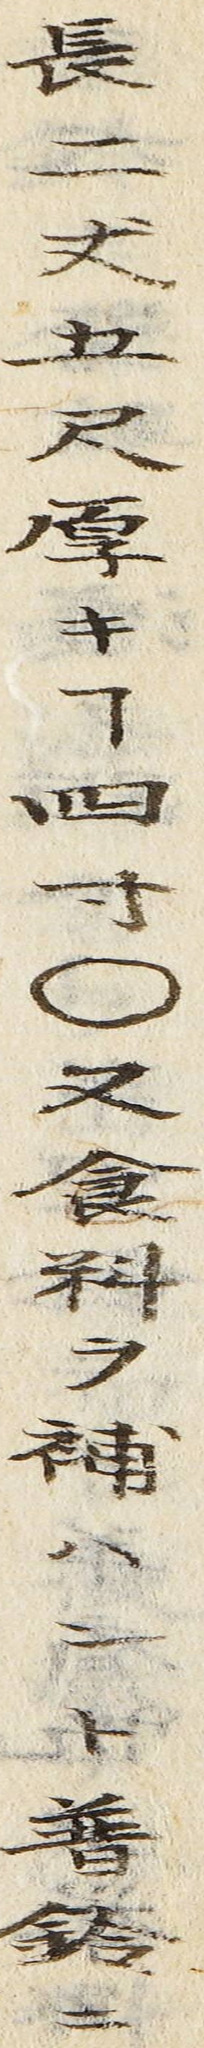長二丈五尺厚キコト四寸◯又食料ヲ補ハント普鈴ニ
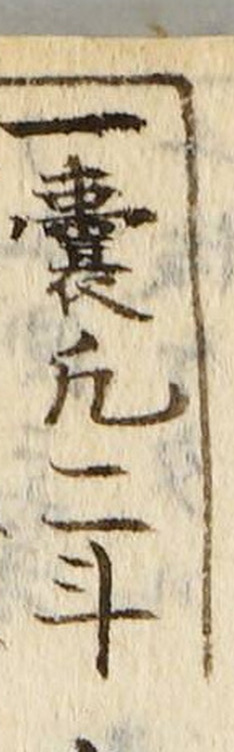一嚢凡二斗
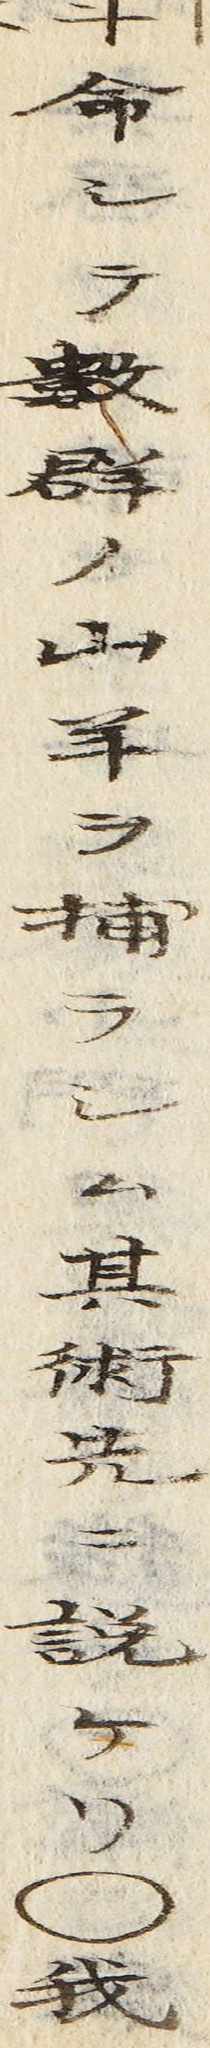命シテ数群ノ山羊ヲ捕ラシム其術先ニ説ケリ◯我
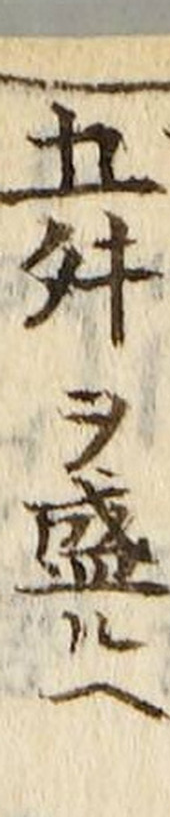五升ヲ盛ルヘ
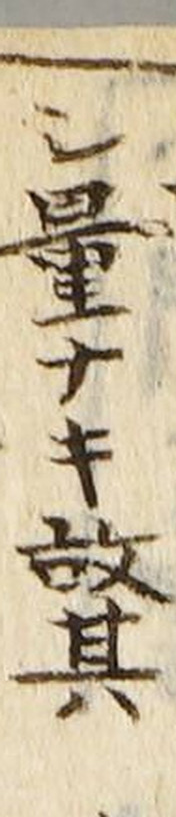シ量ナキ故其
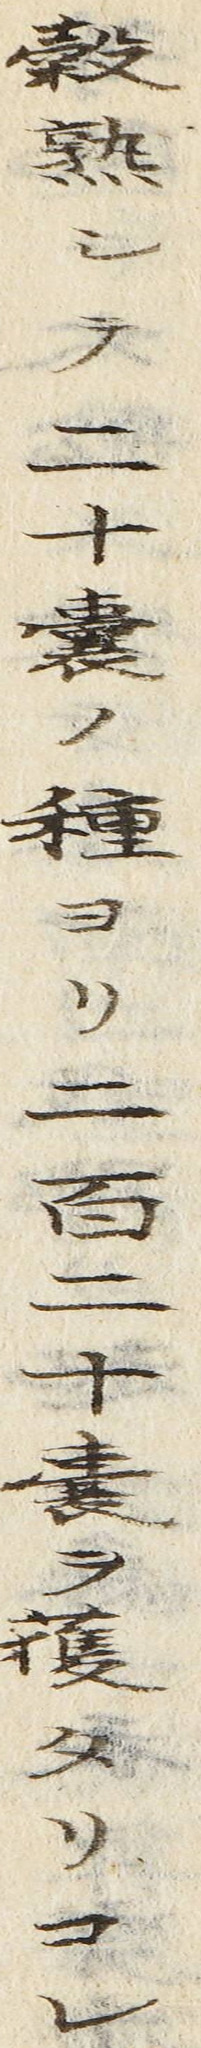穀熟シテ二十嚢ノ種ヨリ二百二十嚢ヲ獲タリコレ
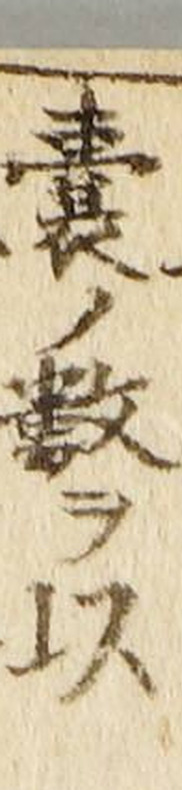嚢ノ数ヲ以
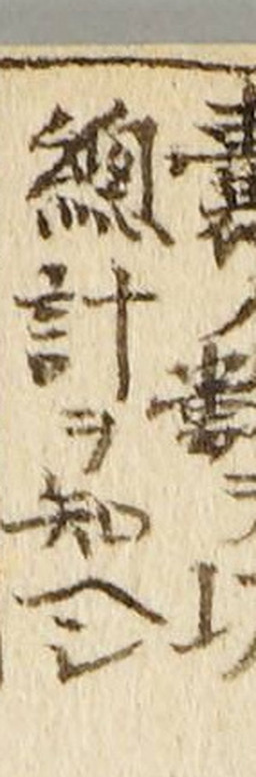総計ヲ知ヘシ
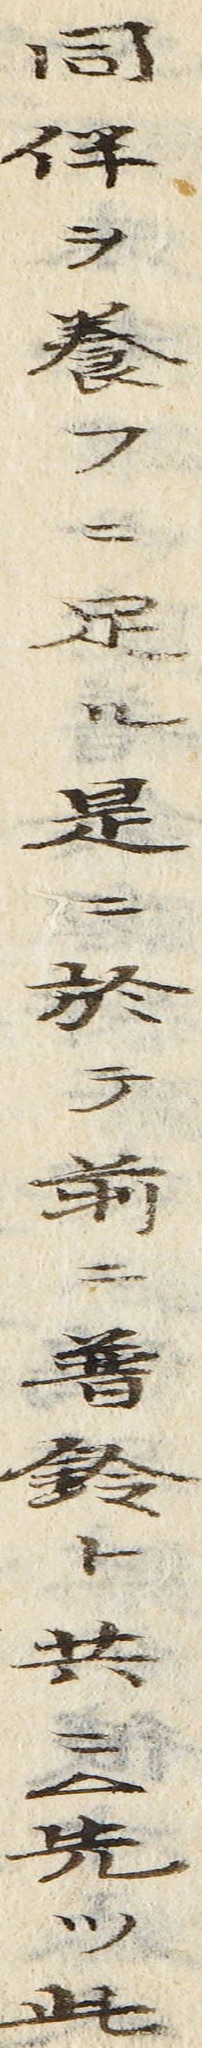同伴ヲ養フニ足ル是ニ於テ前ニ普鈴ト共ニ△先ツ此
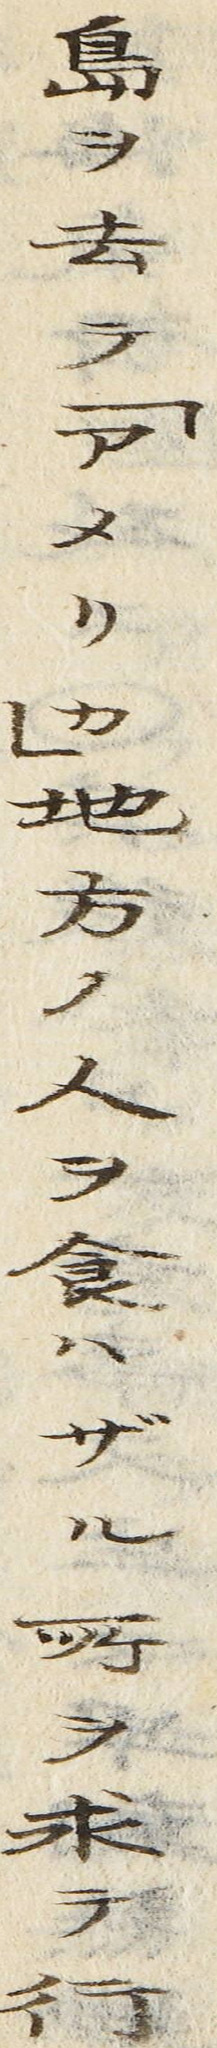島ヲ去テ「アメリカ」地方ノ人ヲ食ハザル所ヲ求テ行
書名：漂流紀事
